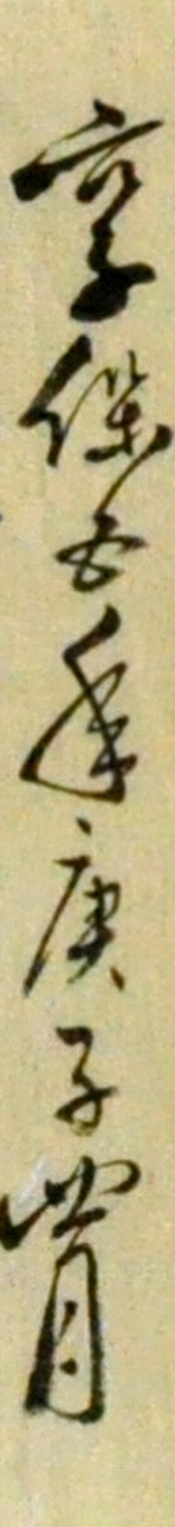享保五年庚子四月
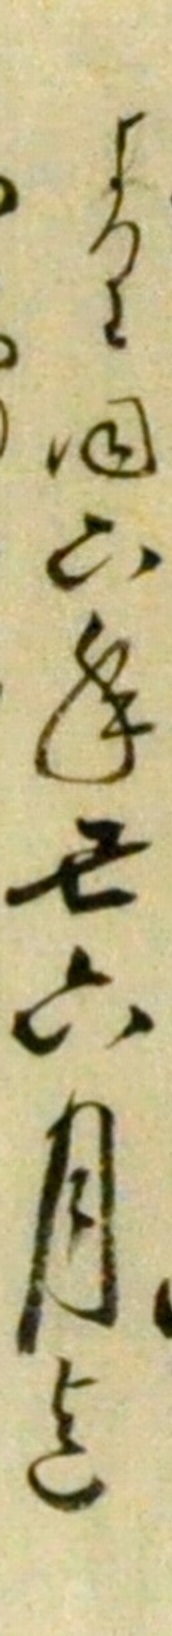より同六年丑六月迄
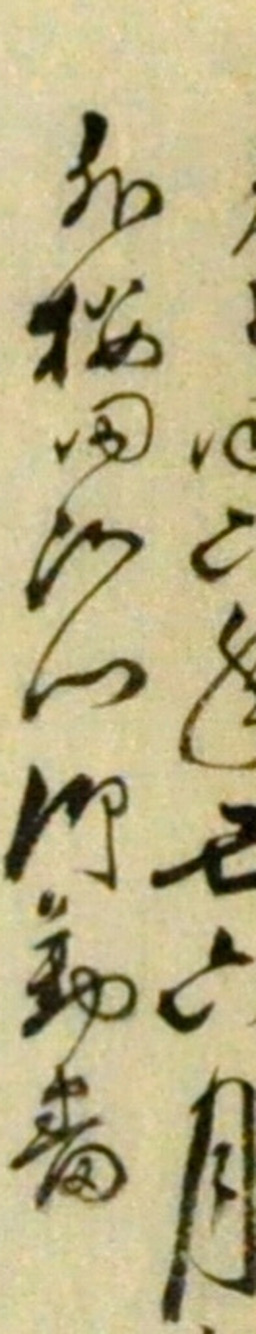外桜田御門御勤番
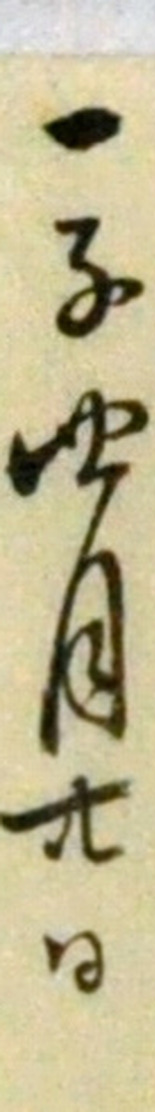一子四月廿日
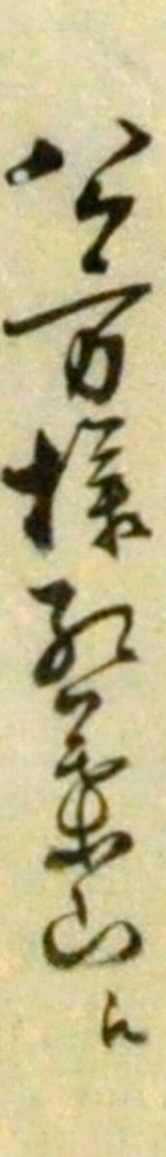公方様紅葉山江
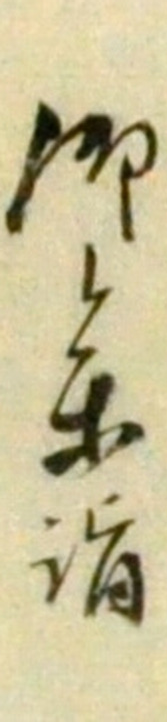御参詣
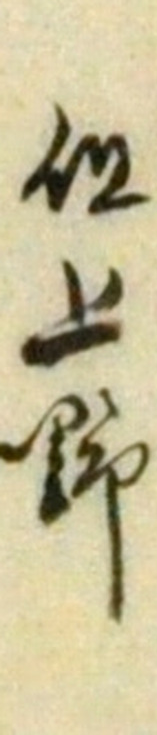但上野
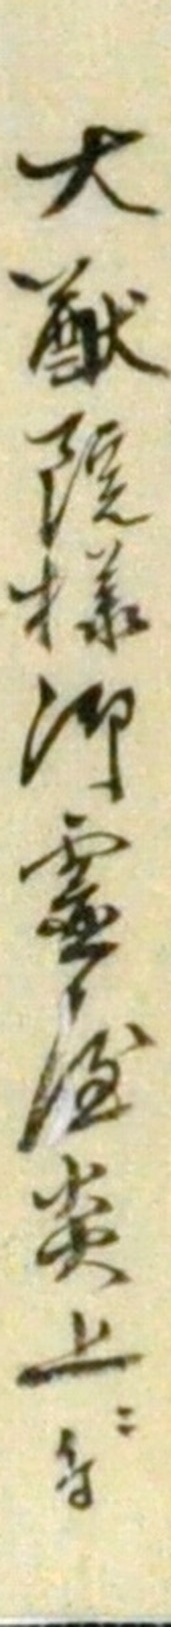大猷院様御霊屋炎上ニ付
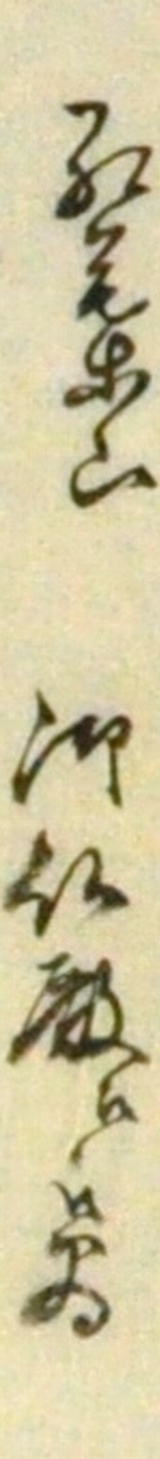紅葉山御仏殿江被為
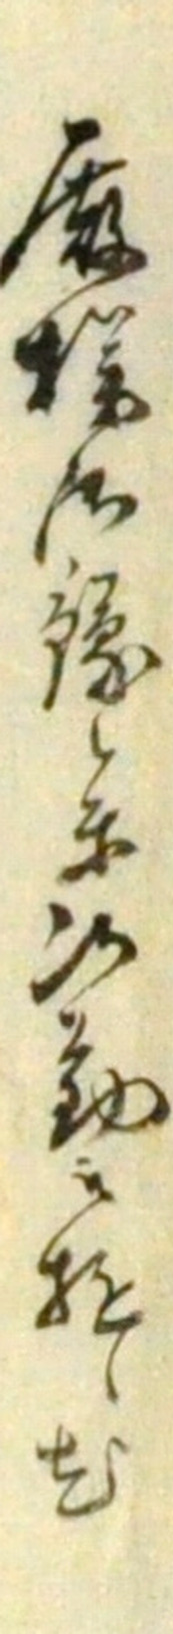殿様御予参御勤被遊候尤
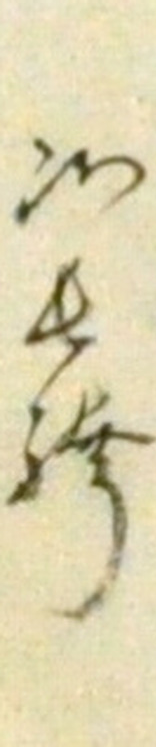御長袴
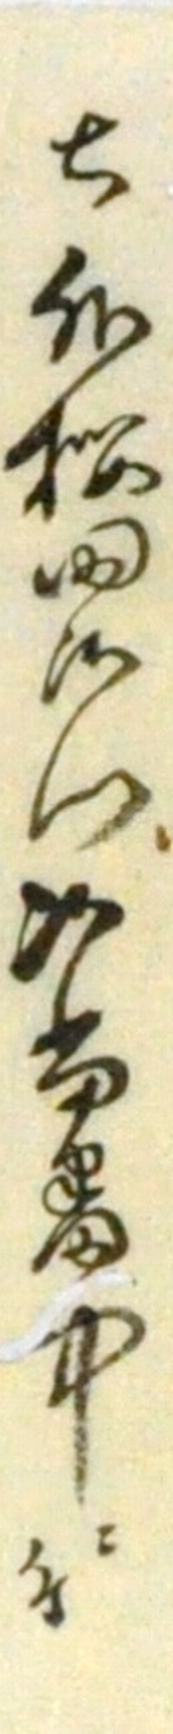右外桜田御門御当番中ニ付
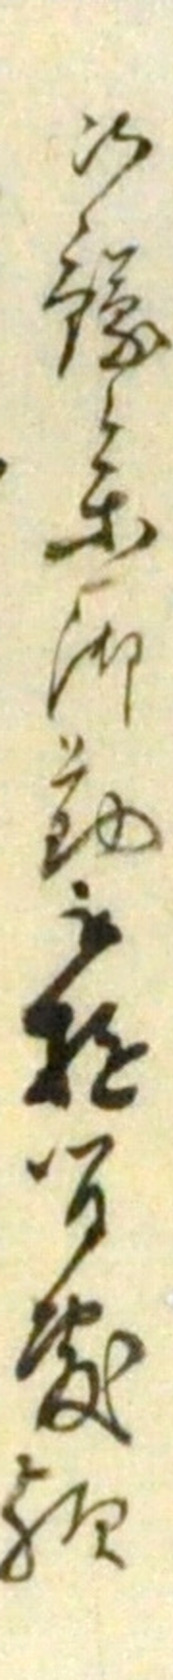御予参御勤被遊間敷歟
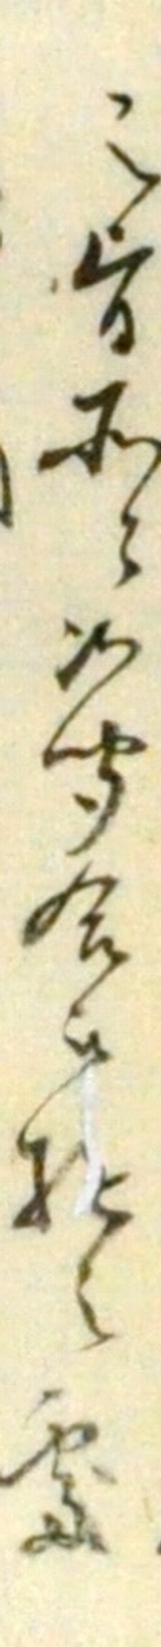之旨所々御聞合被遊之處
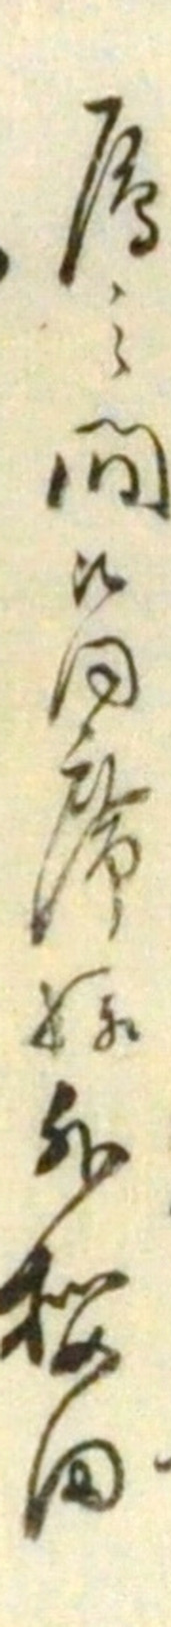鳫之間御同席様外桜田
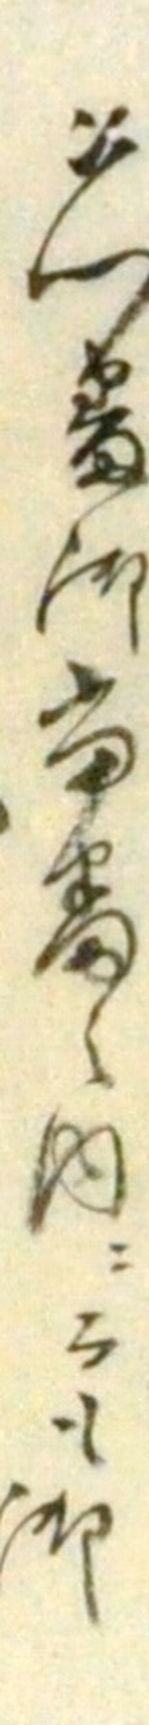御門番御当番之内ニ而も御
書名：覚
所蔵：伊那市立高遠町図書館・合同会社AMANE
